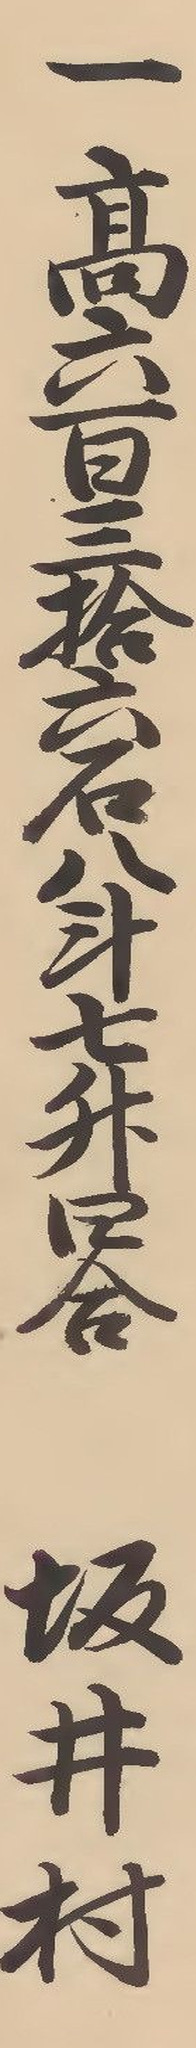一高六百三拾六石八斗七升四合坂井村
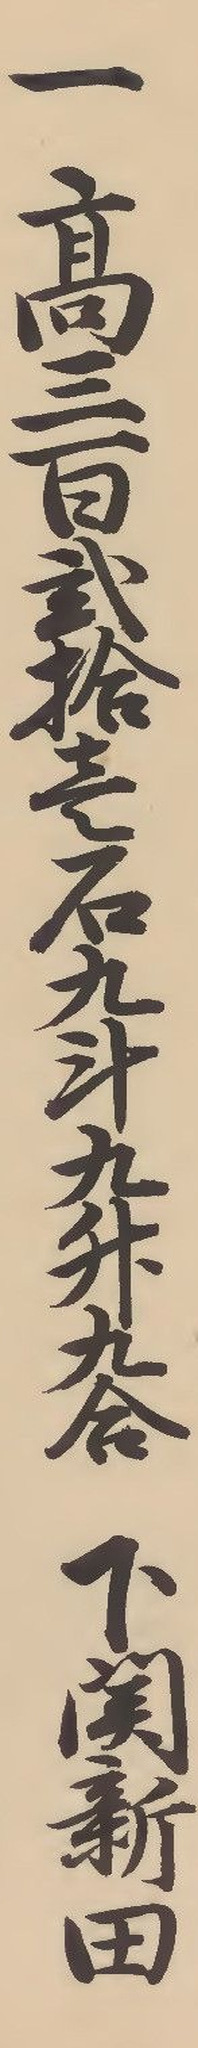一高三百弐拾壱石九斗九升九合下関新田
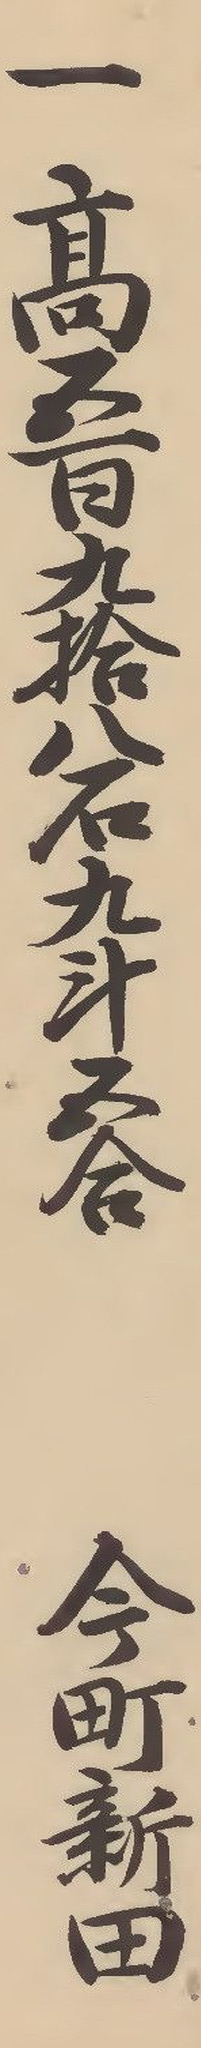一高五百九拾八石九斗五合今町新田
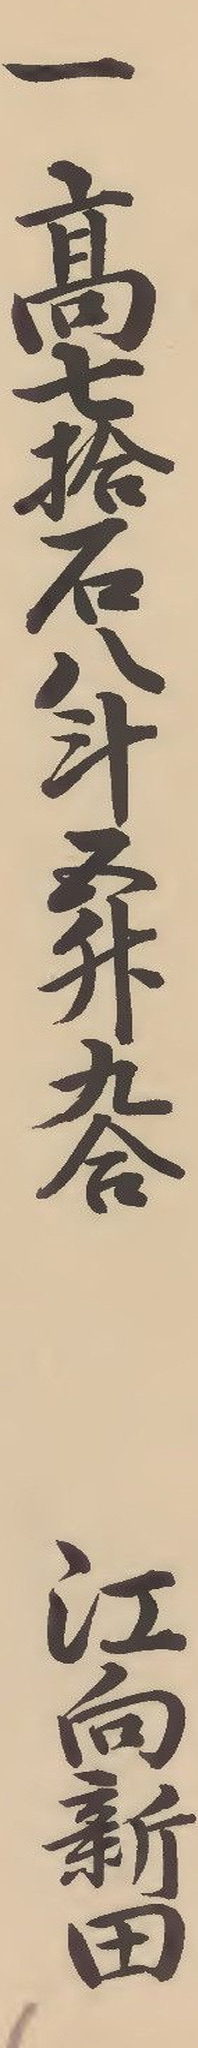一高七拾石八斗五升九合江向新田
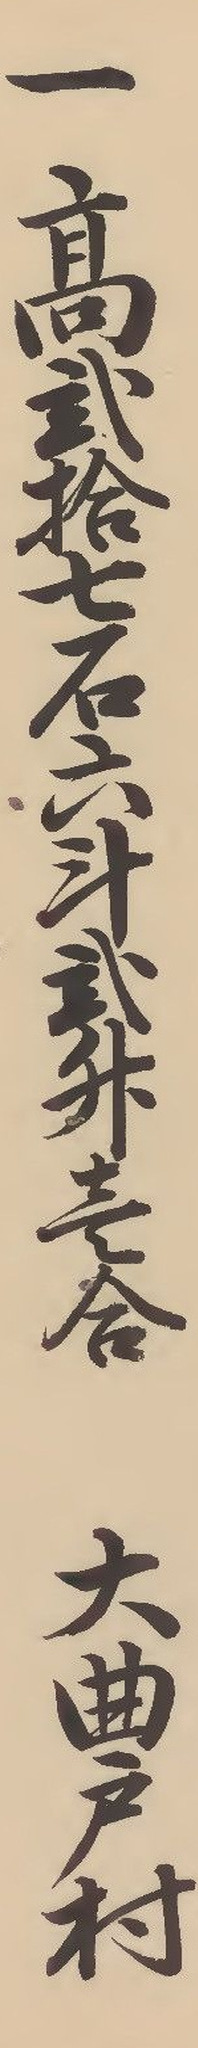一高弐拾七石六斗弐升壱合大曲戸村

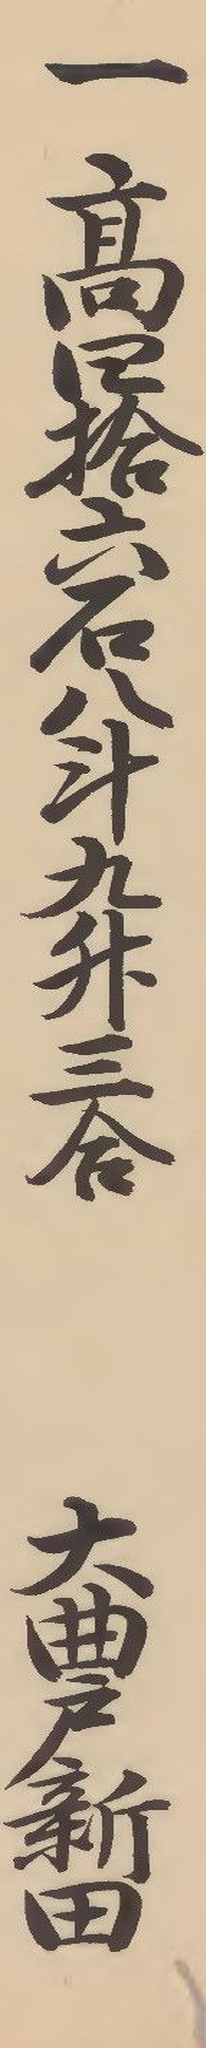一高四拾六石八斗九升三合大曲戸新田
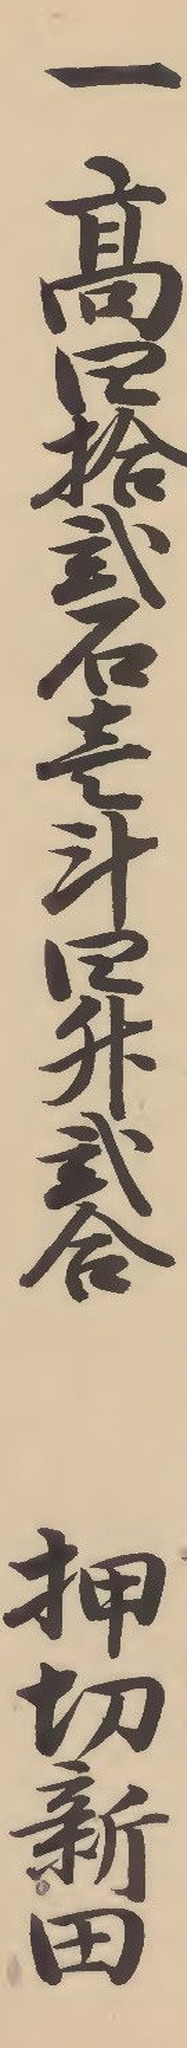一高四拾弐石壱斗四升弐合押切新田
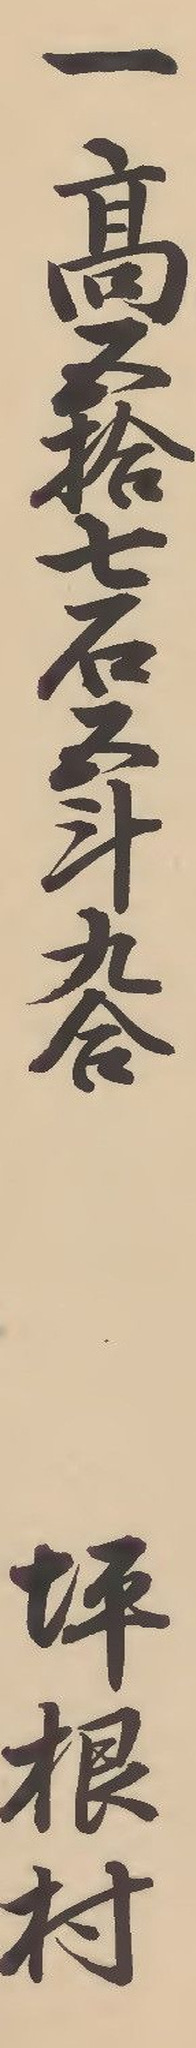一高五拾七石五斗九合坪根村
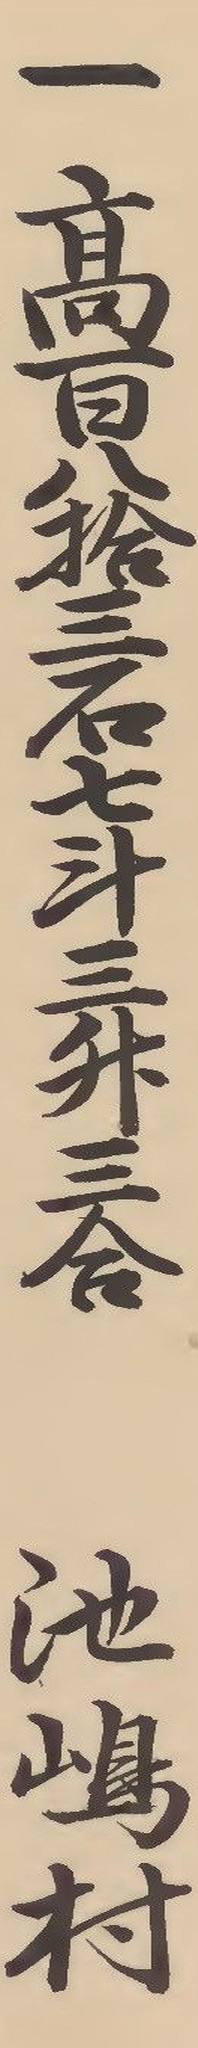一高百八拾三石七斗三升三合池島村
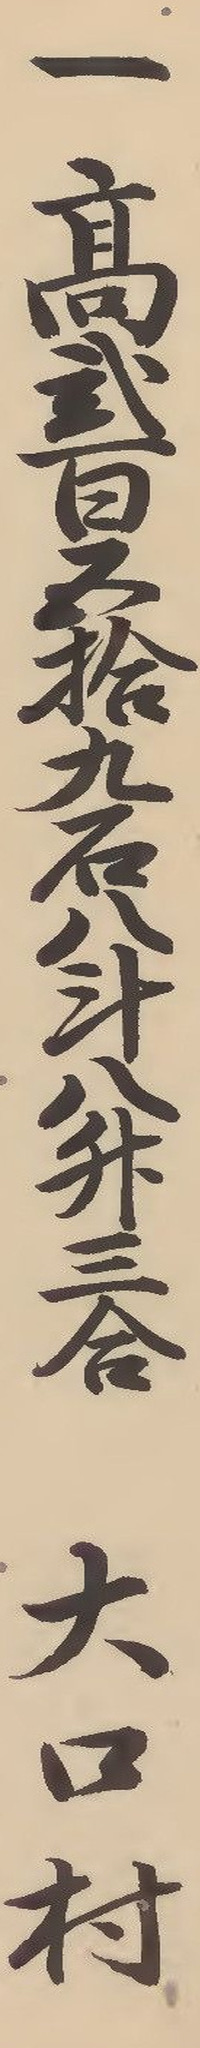一高弐百五拾九石八斗八升三合大口村
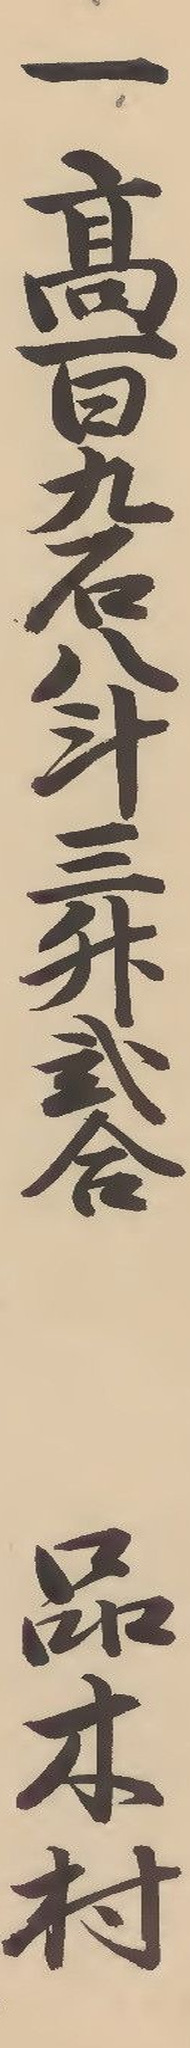一高百九石八斗三升弐合品木村
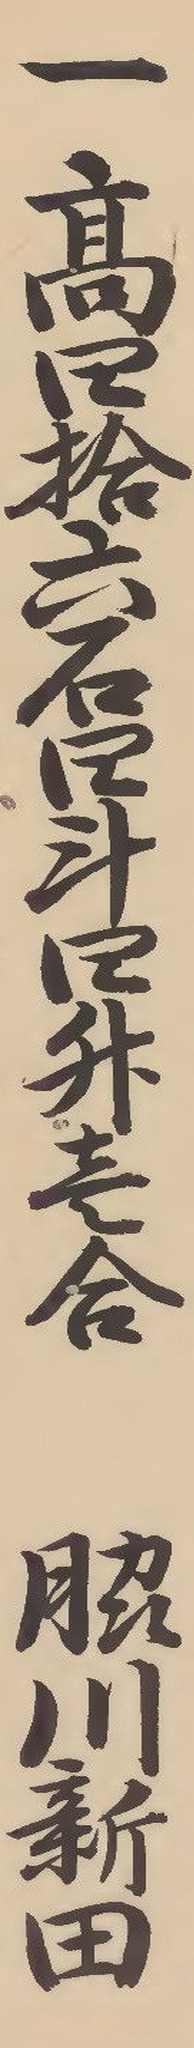一高四拾六石四斗四升壱合脇川新田

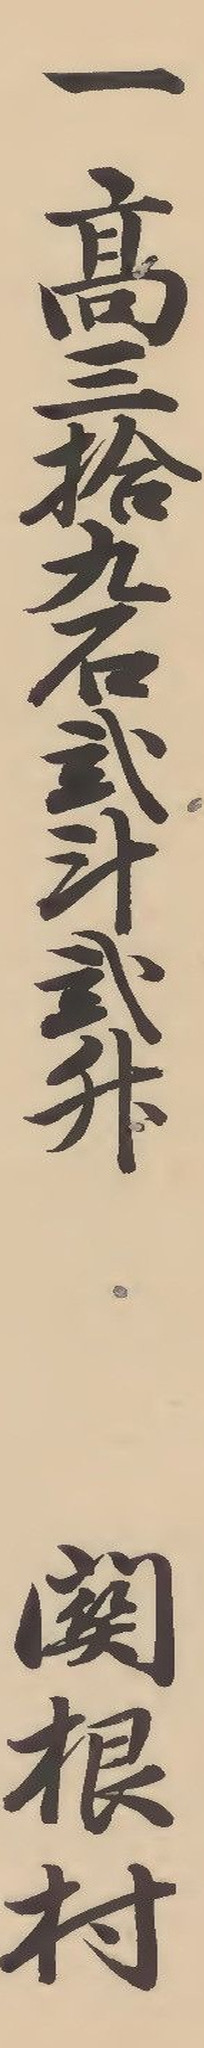一高三拾九石弐斗弐升関根村
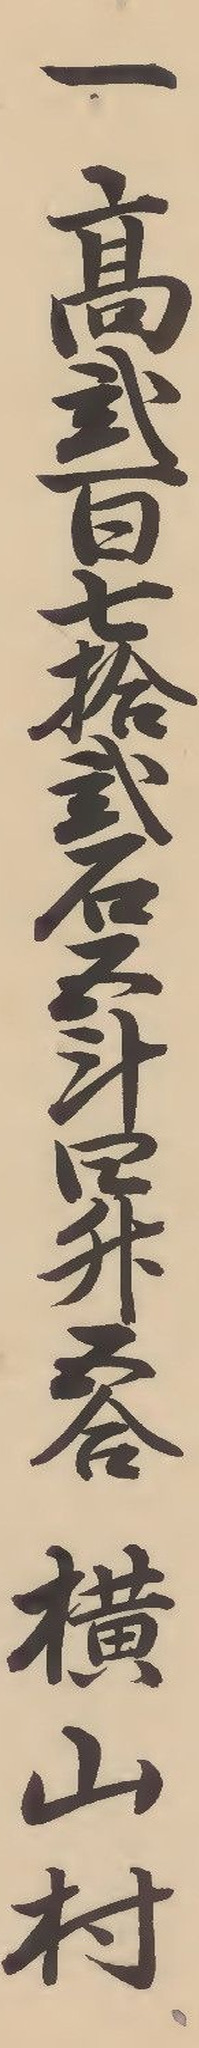一高弐壱百七拾弐石五斗四升五合横山村
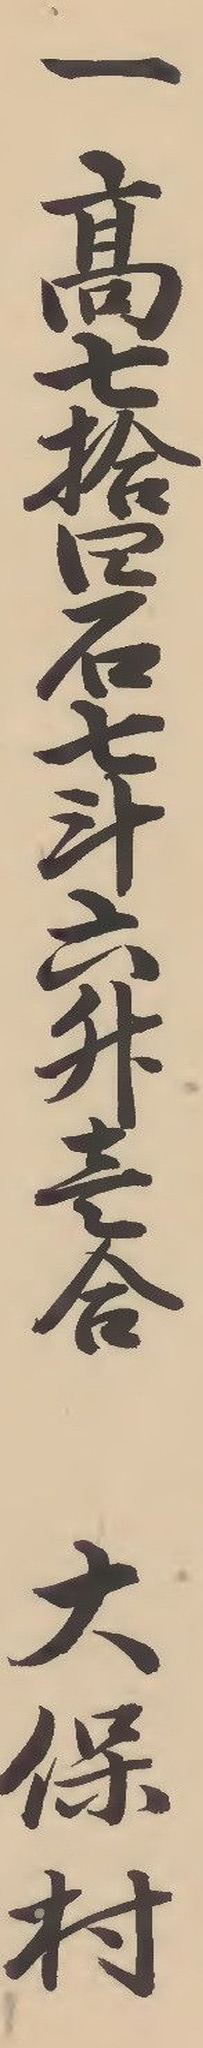一高七拾四石七斗六升壱合大保村
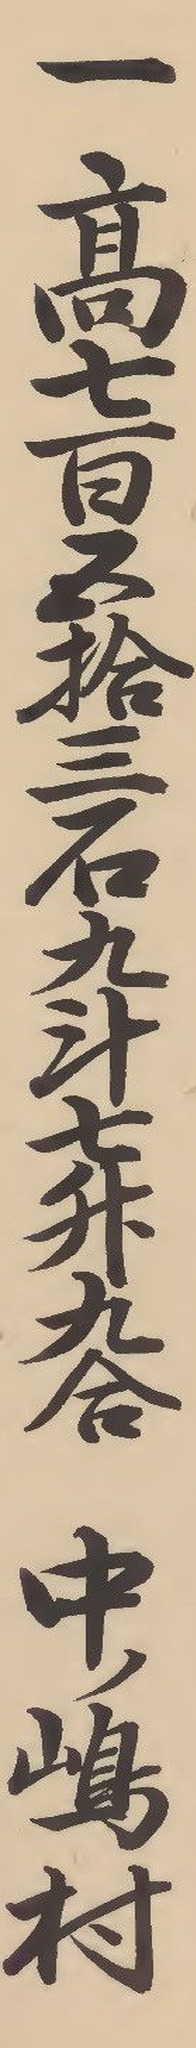一高七百五拾三石九斗七升九合中ノ島村
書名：越後国郷帳　下
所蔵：国立公文書館 National Archives of Japan
